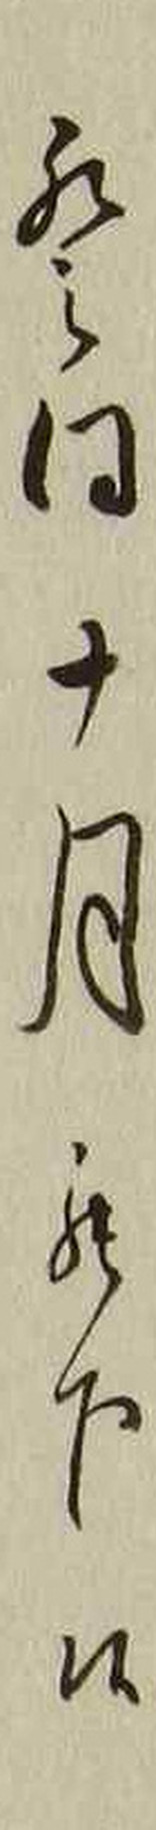登同十月罷下候
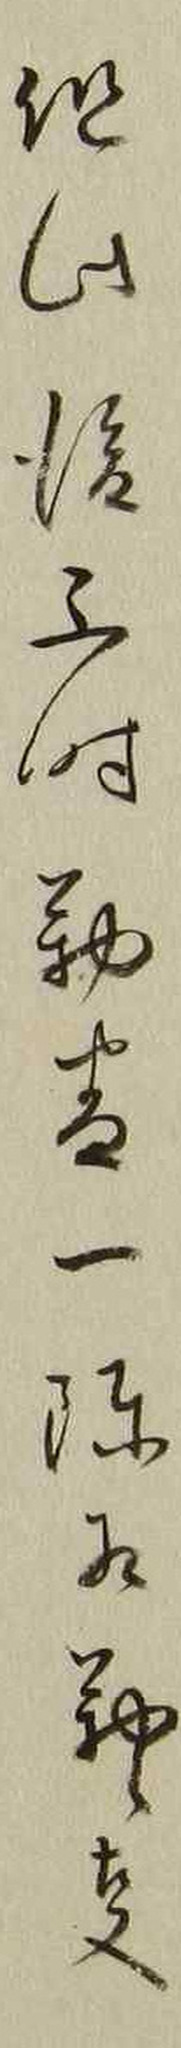但此後不時勤番一陣相勤候事
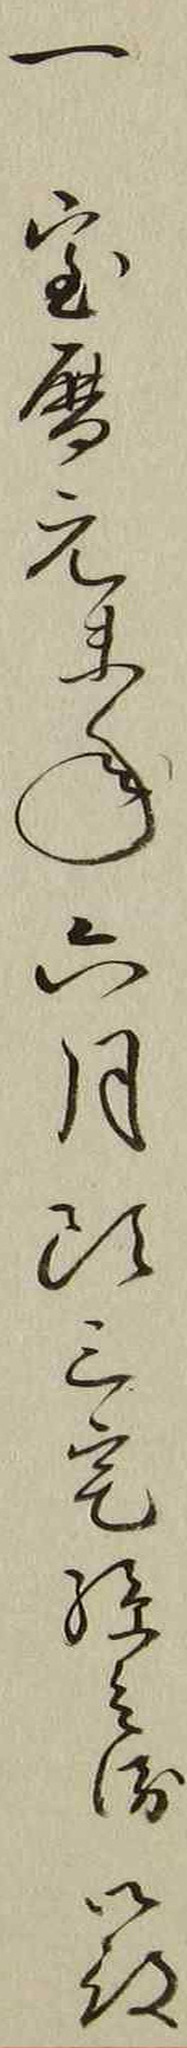一宝暦元未年六月頭三宅孫兵衛御役
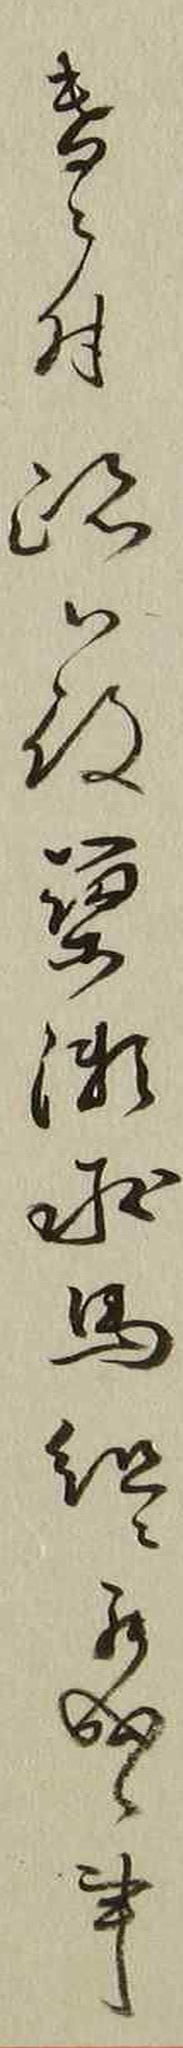替に付跡御役簗瀬求馬組に罷成候事
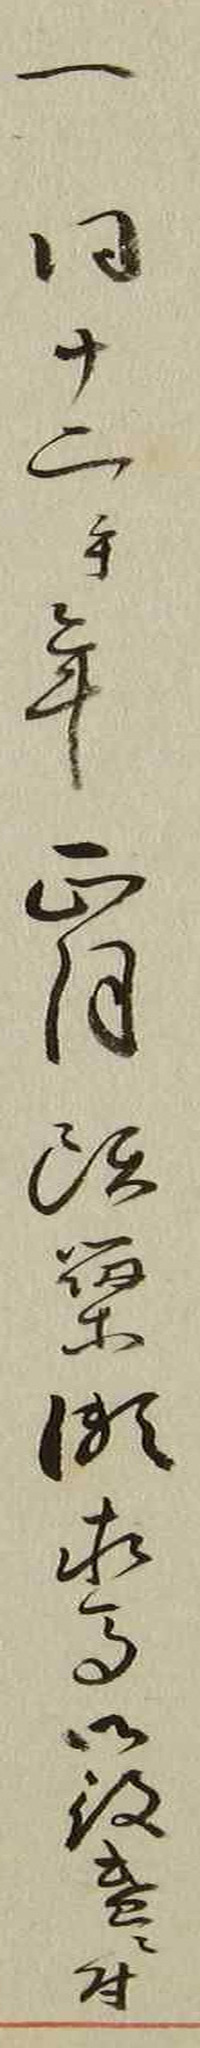一同十二午年正月頭簗瀬求馬御役替に付
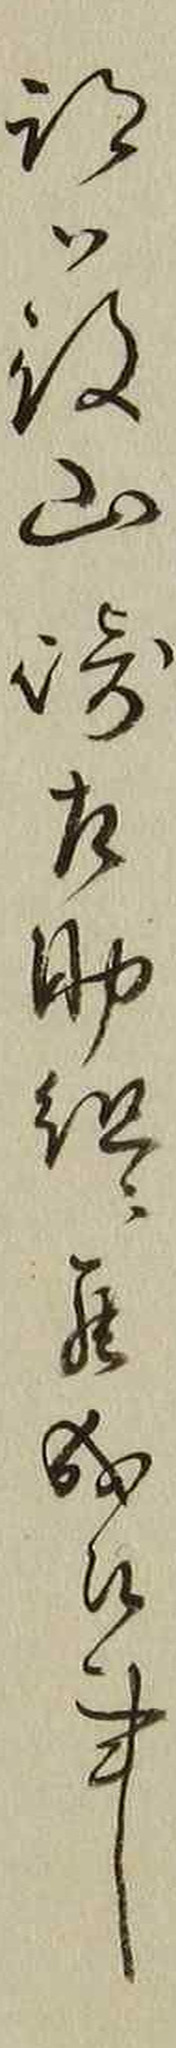跡御役山崎左助組に罷成候事
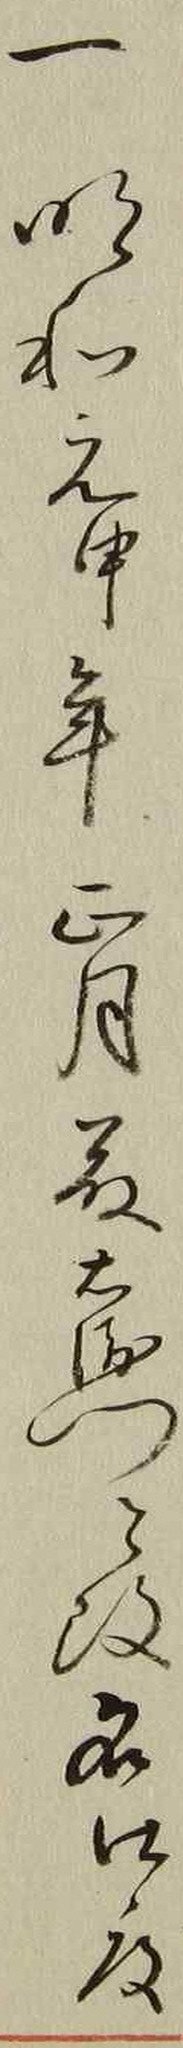一明和元申年正月藤右衛門と改名仕度
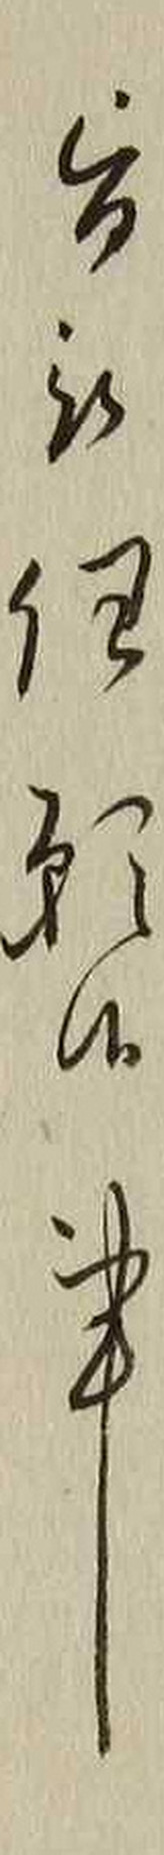旨被任願候事
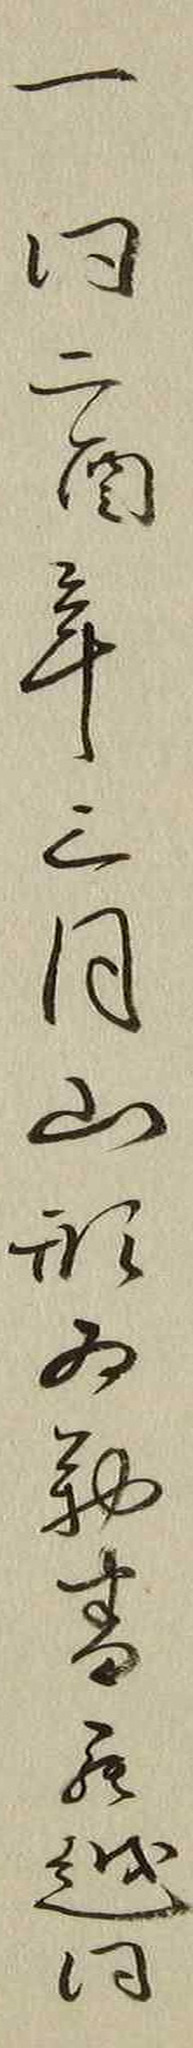一同二酉年三月山形為勤番罷越同
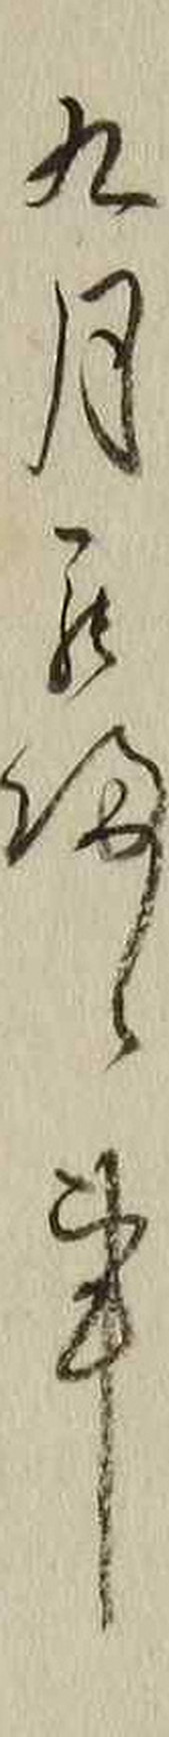九月罷帰候事
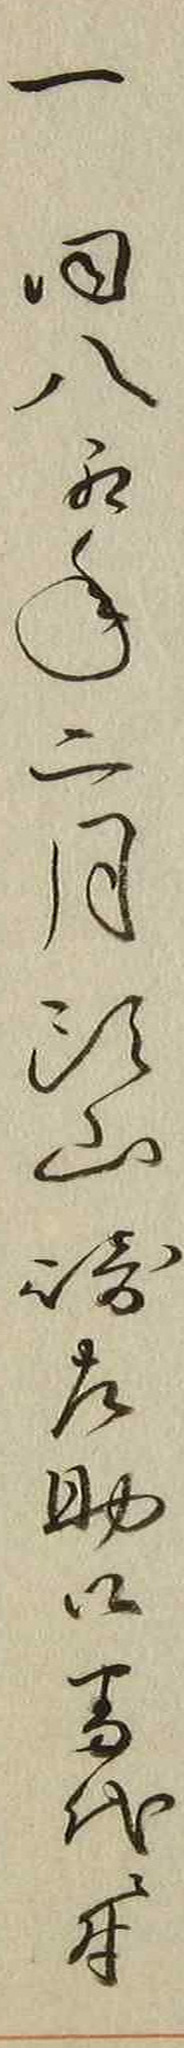一同八卯年二月頭山崎左助御番代に付
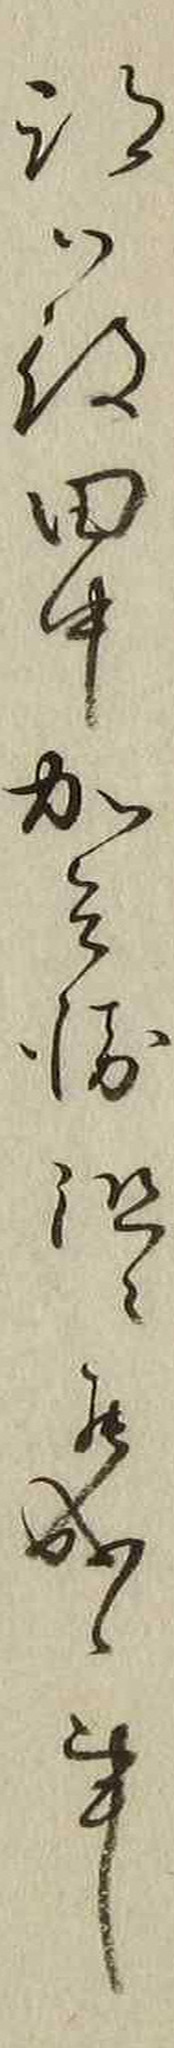跡御役田中加兵衛組に罷成候事
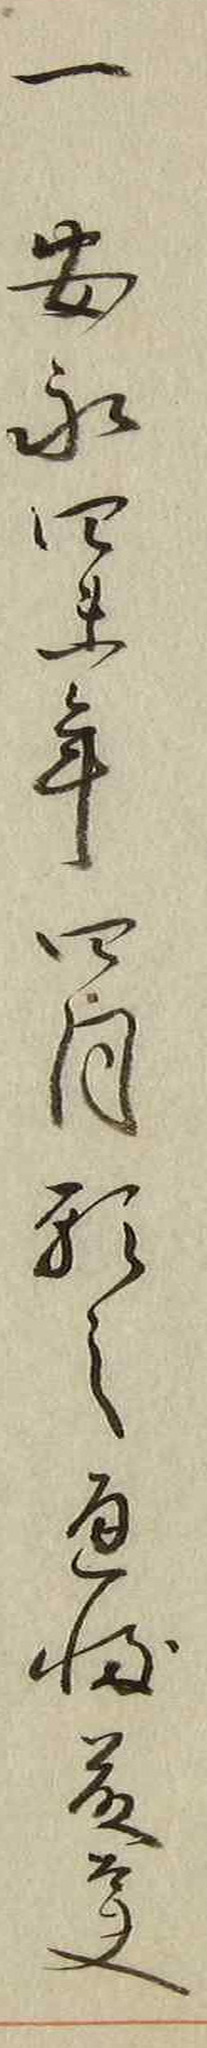一安永四未年四月願之通悴藤太夫
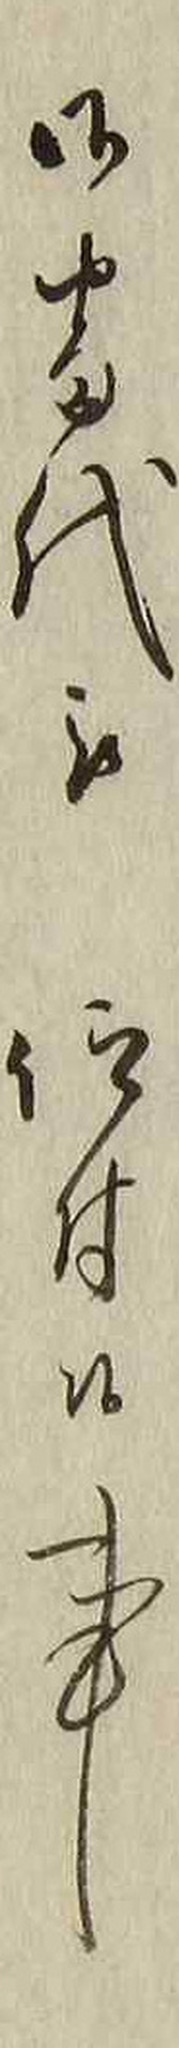御番代被仰付候事
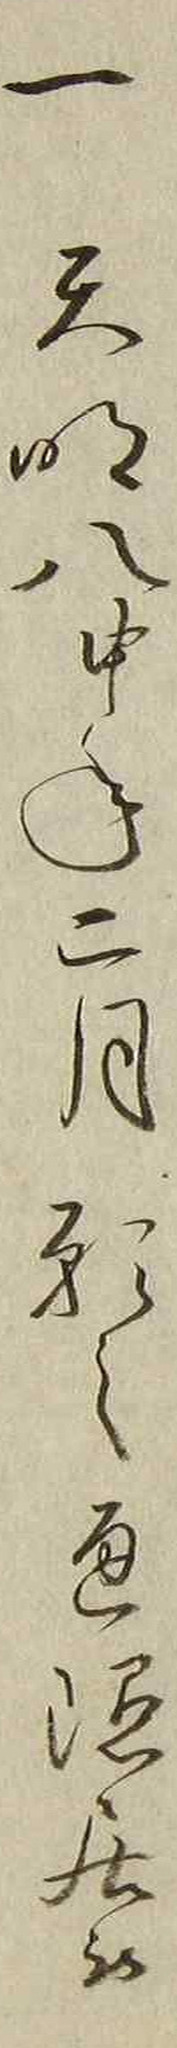一天明八申年二月願之通隠居被
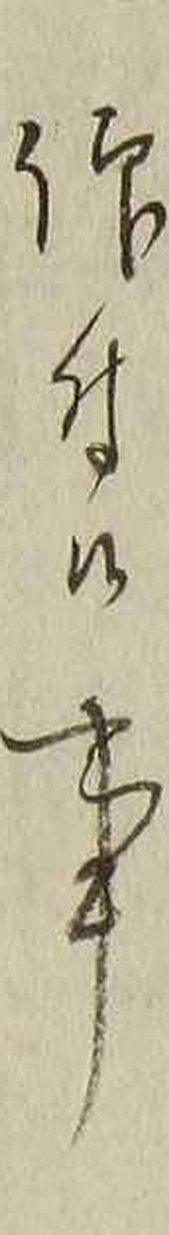仰付候事
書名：諸士系譜　巻之3　い之部3
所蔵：会津若松市立会津図書館
